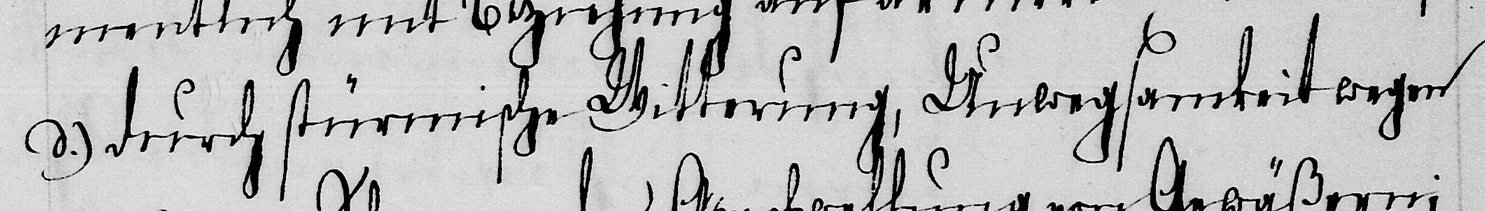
d.) durch stürmische Witterung, Unwegsamkeit wegen
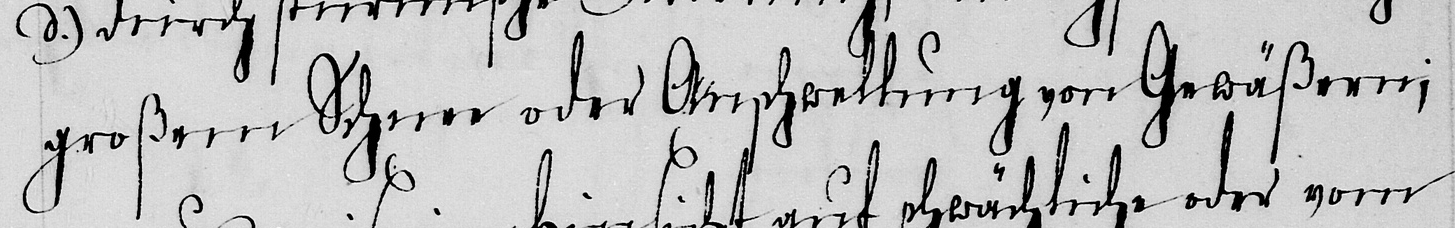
großem Schnee oder Anschwellung von Gewäßern;
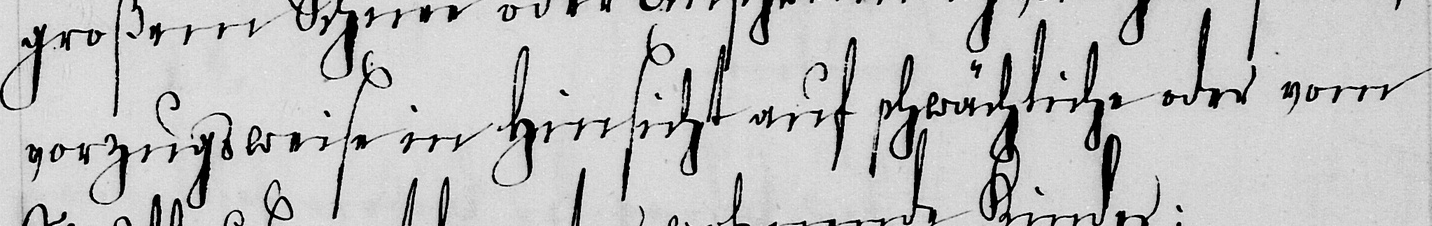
vorzugsweise in Hinsicht auf schwächliche oder vom
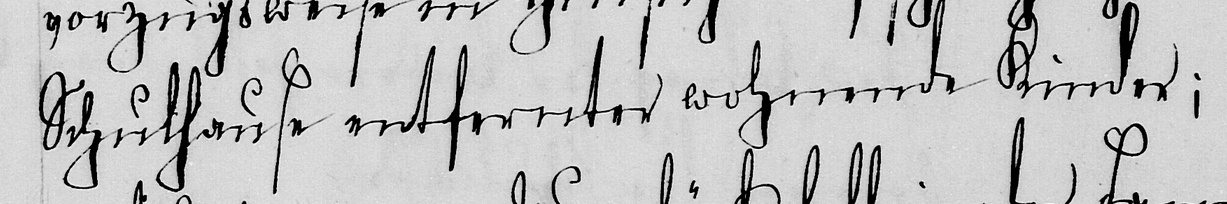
Schulhause entfernter wohnende Kinder;
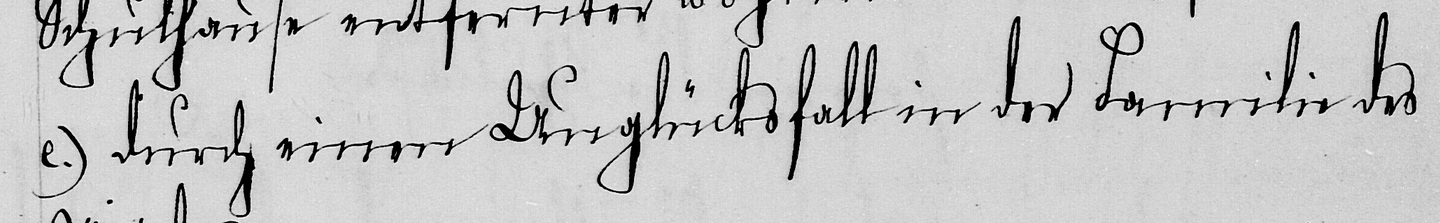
e.) durch einen Unglücksfall in der Familie des
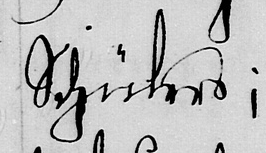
Schülers;
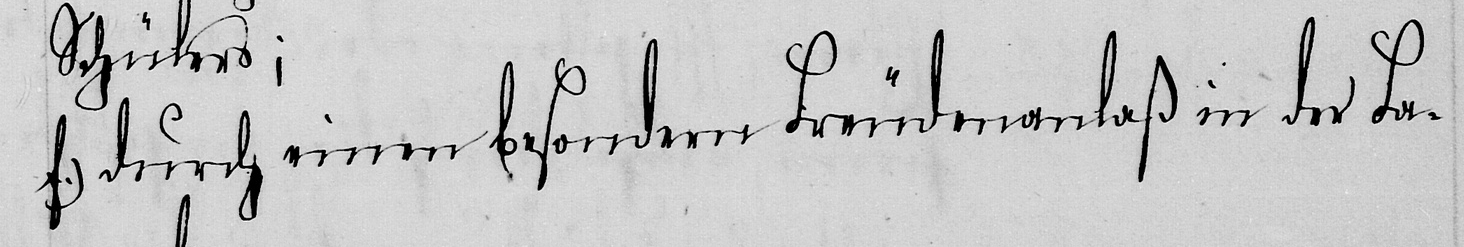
durch einen besondern Freudenanlaß in der Fa¬
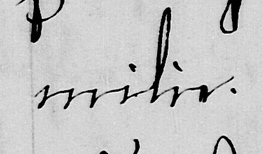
milie.
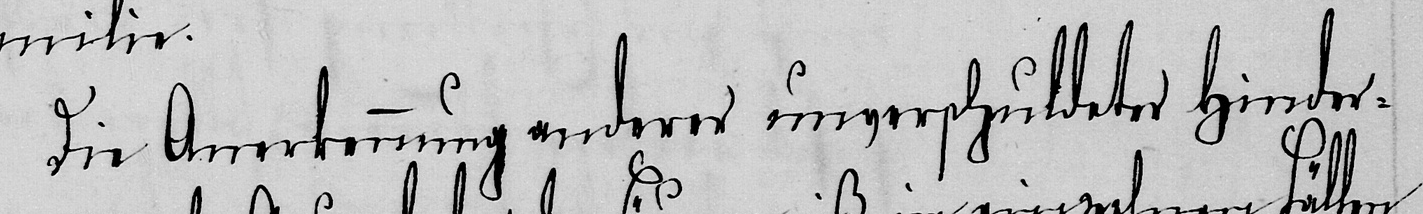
Die Anerkennung anderer unverschuldeter Hinder¬
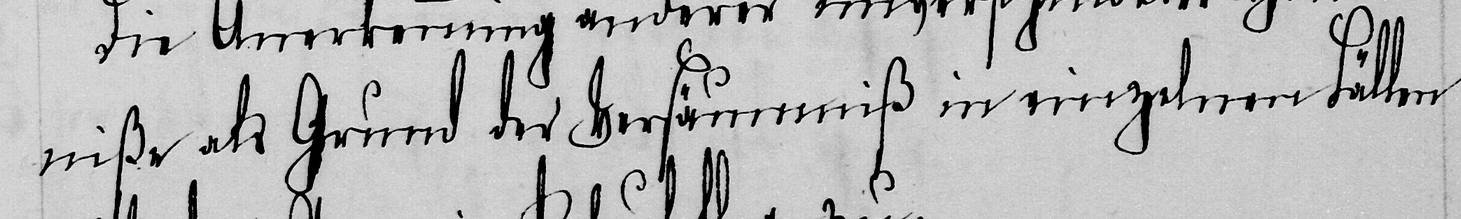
niße als Grund der Versäumniß in einzelnen Fällen
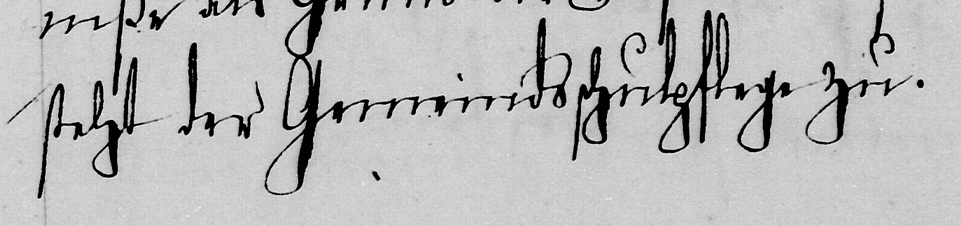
steht der Gemeindsschulpflege zu.
